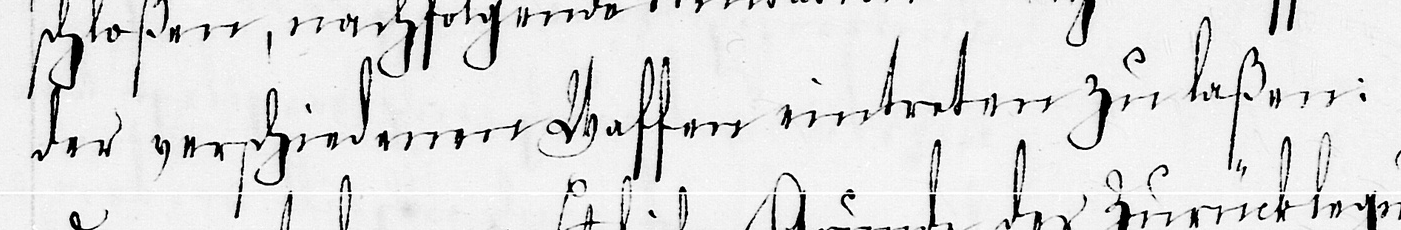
der verschiedenen Waffen eintreten zu laßen:
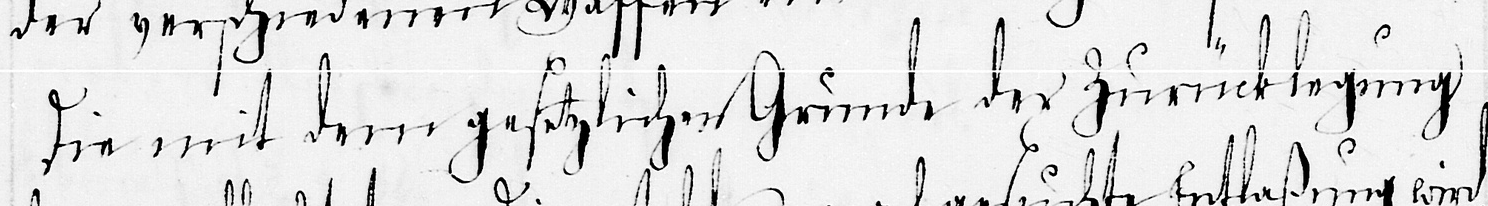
Die mit dem gesetzlichen Grunde der Zurücklegung
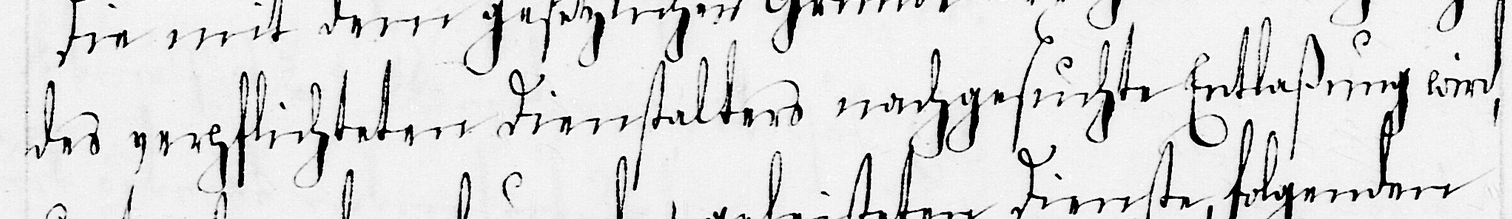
des verpflichteten Dienstalters nachgesuchte Entlaßung wird,
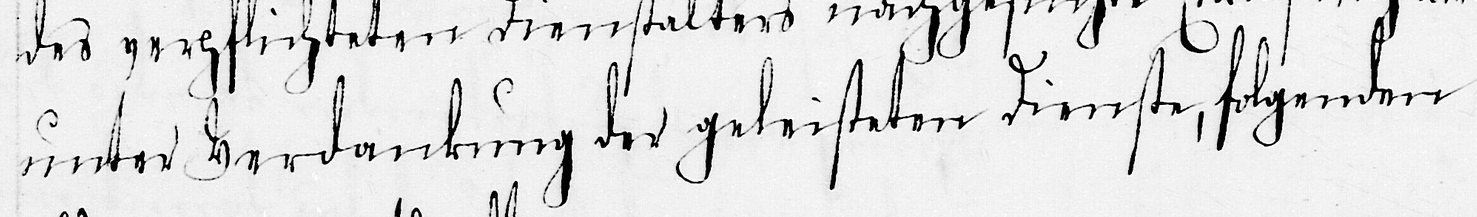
unter Verdankung der geleisteten Dienste, folgenden
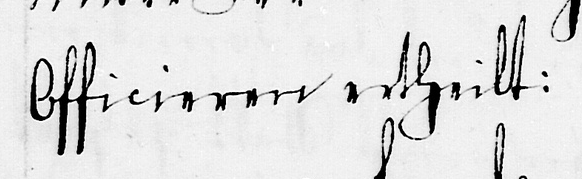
Officieren ertheilt:
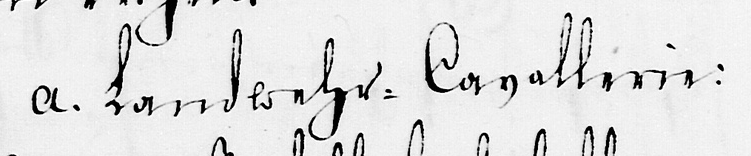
a. Landwehr-Cavallerie:
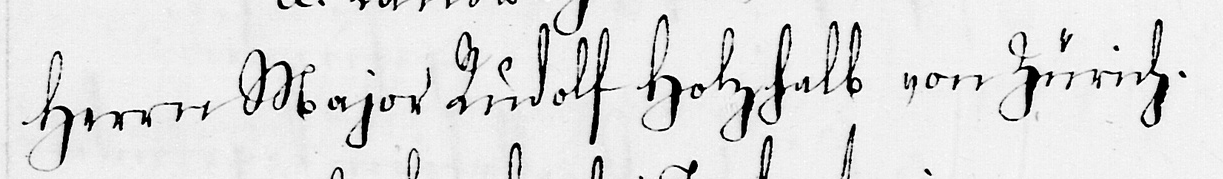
Herrn Major Rudolf Holzhalb von Zürich.
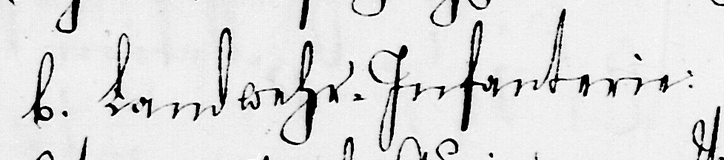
b. Landwehr-Infanterie:
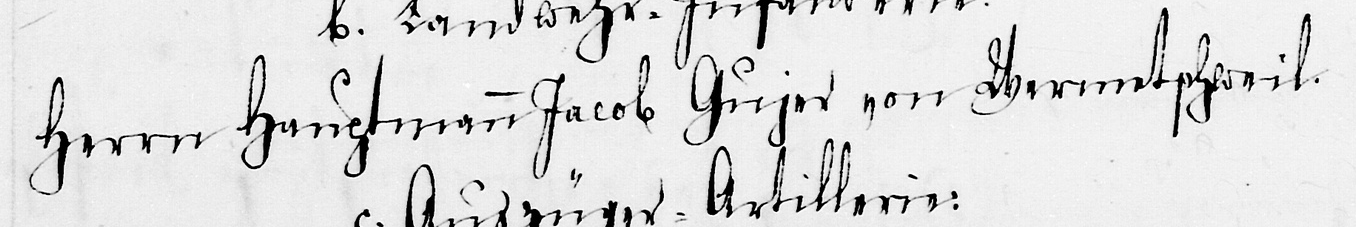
Herrn Hauptmann Jacob Gujer von Wermetschweil.
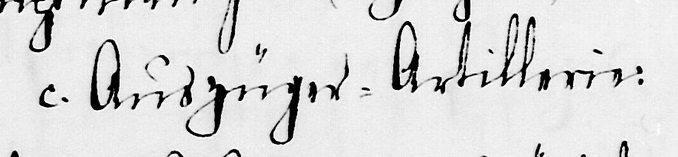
c. Auszüger-Artillerie:
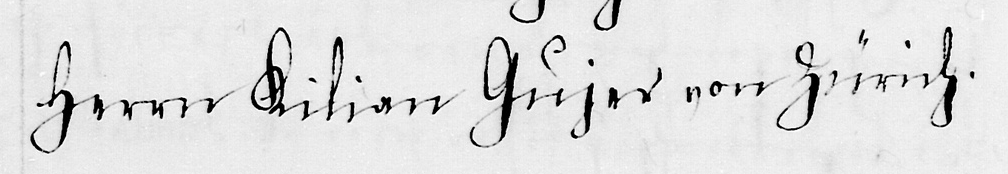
Herrn Kilian Gujer von Zürich.
